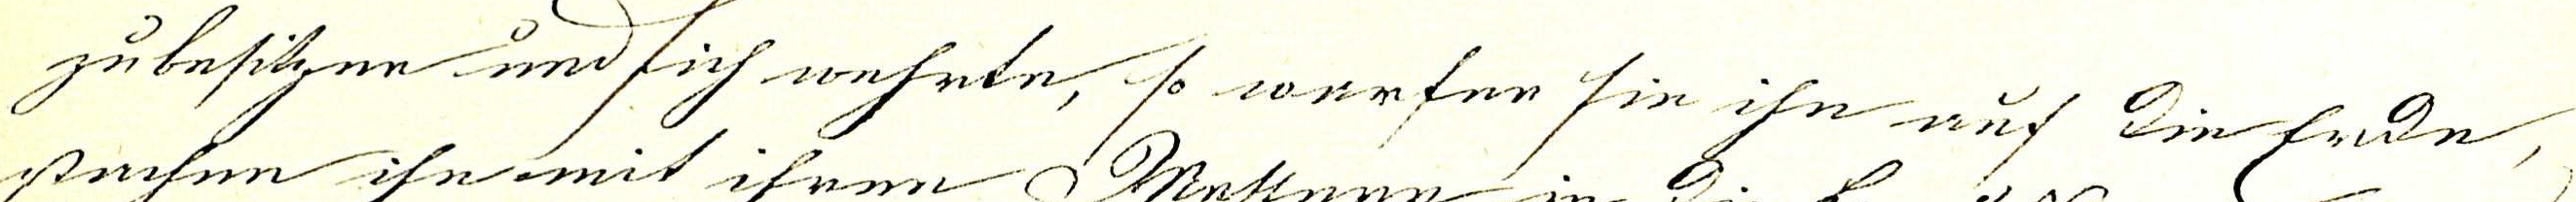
zu besitzen und sich wehrte, so warfen sie ihn auf die Erde,
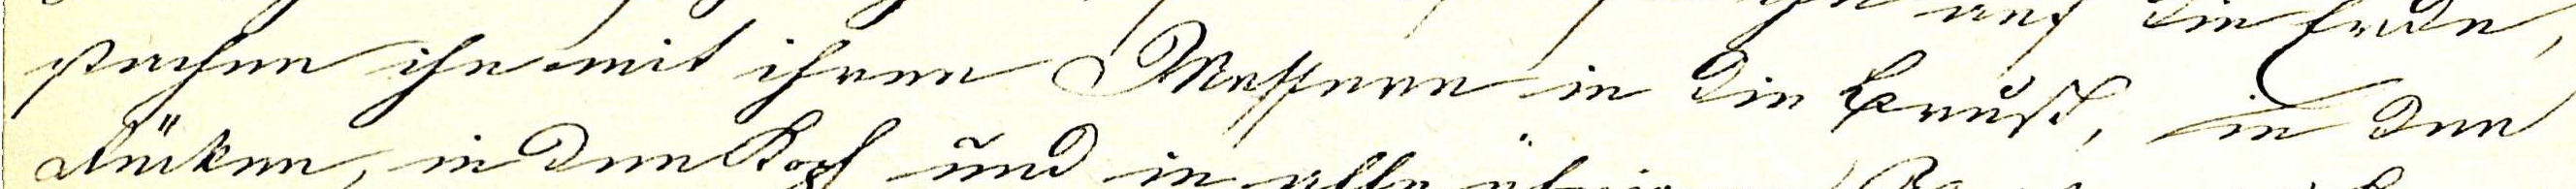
stachen ihn mit ihren Messern in die Brust, in den
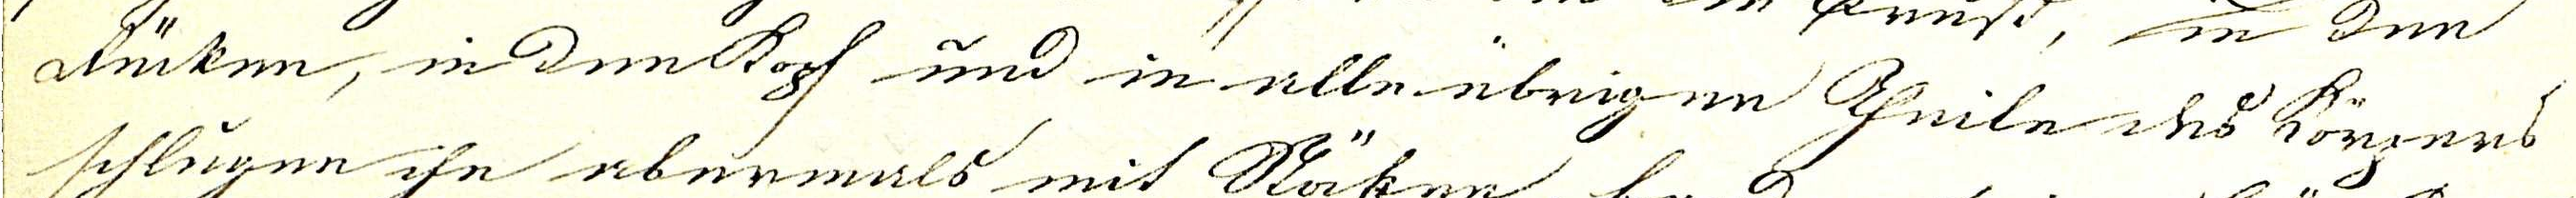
Rücken, in den Kopf und in alle übrigen Theile des Körpers
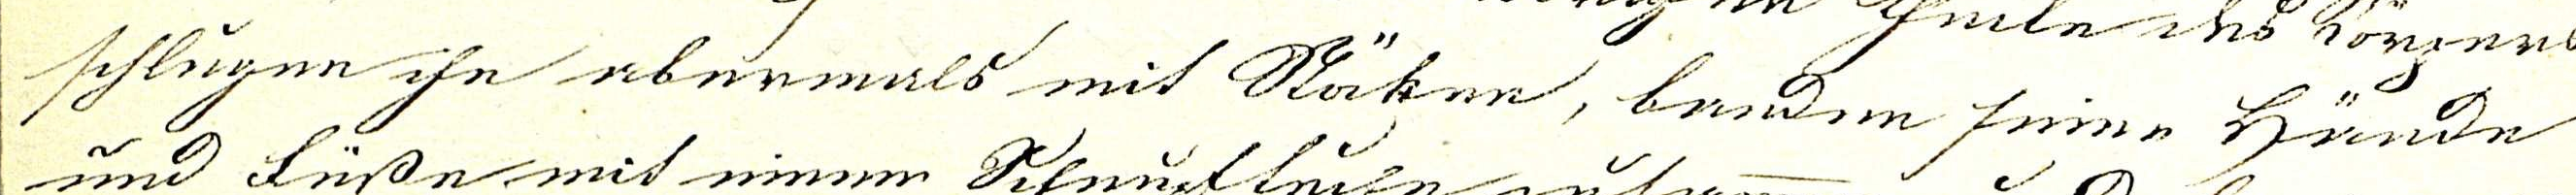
schlugen ihn abermals mit Stöcken, banden seine Hände
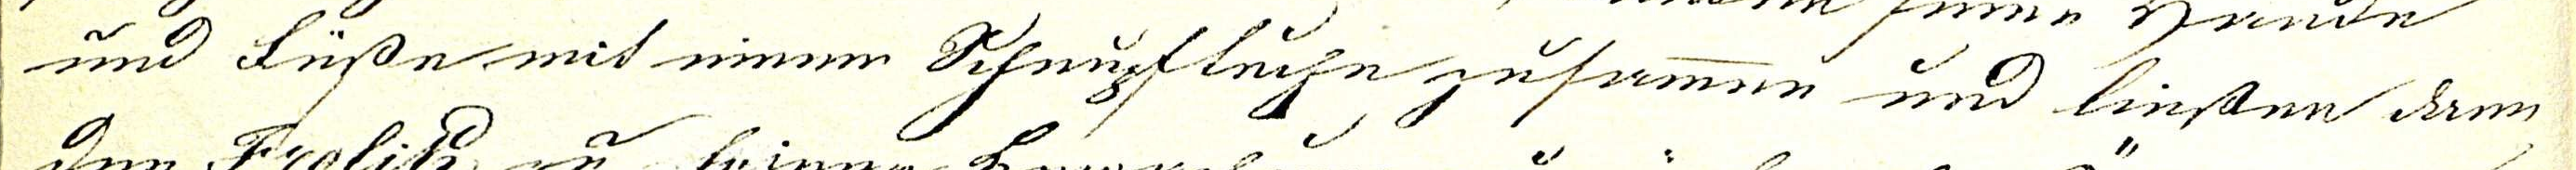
und Füße mit einem Schnupfluche zusammen und ließen dann
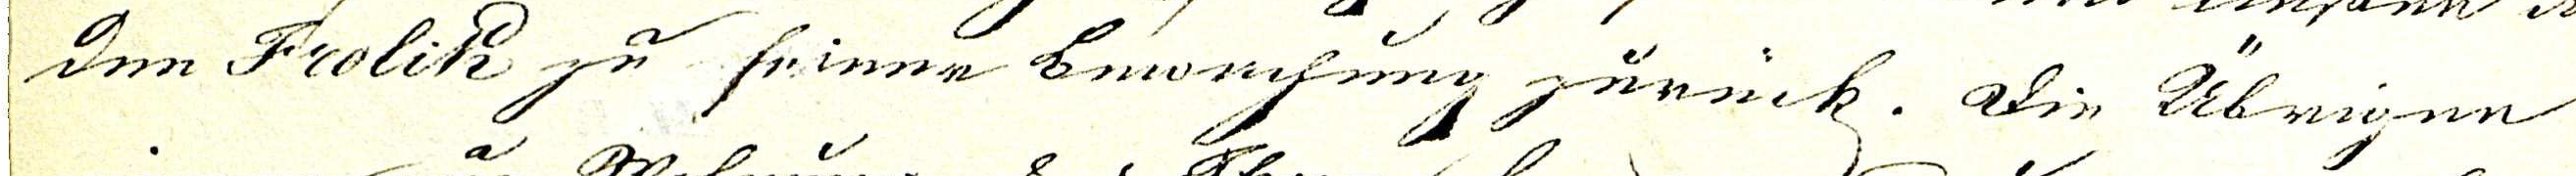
den Frolik zu seiner Bewachung zurück. Die Übrigen
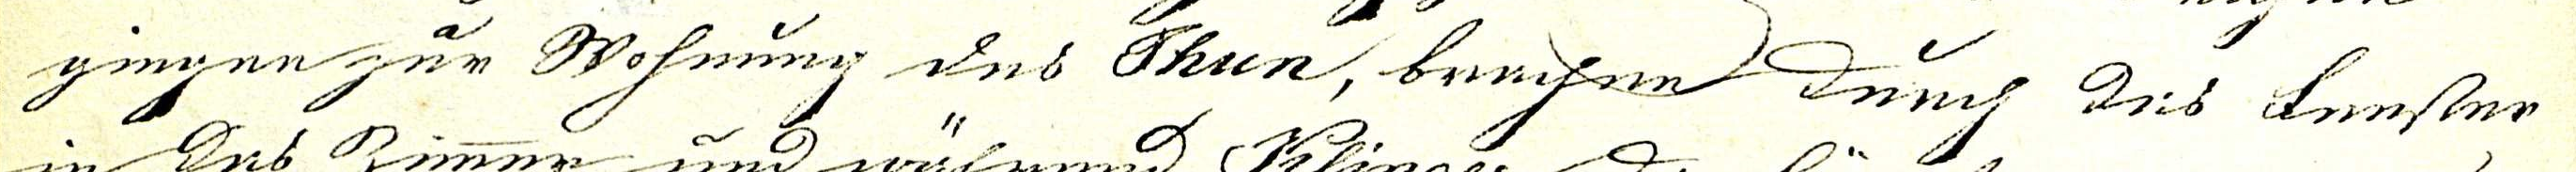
gingen zur Wohnung des Thun, brachen durch das Fenster
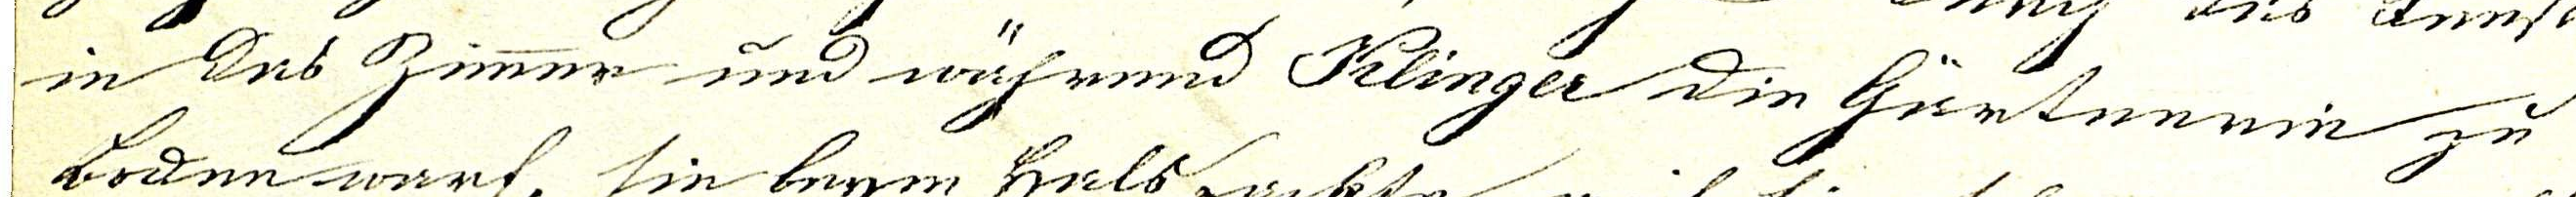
in das Zimmer und während Klinger die Gärtnerin zu
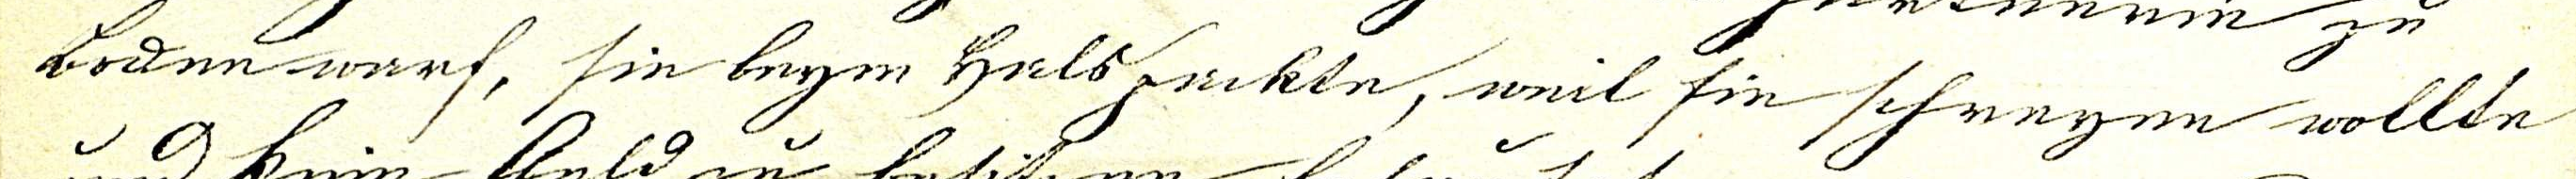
Boden warf, sie beym Hals packte, weil sie schreyen wollte
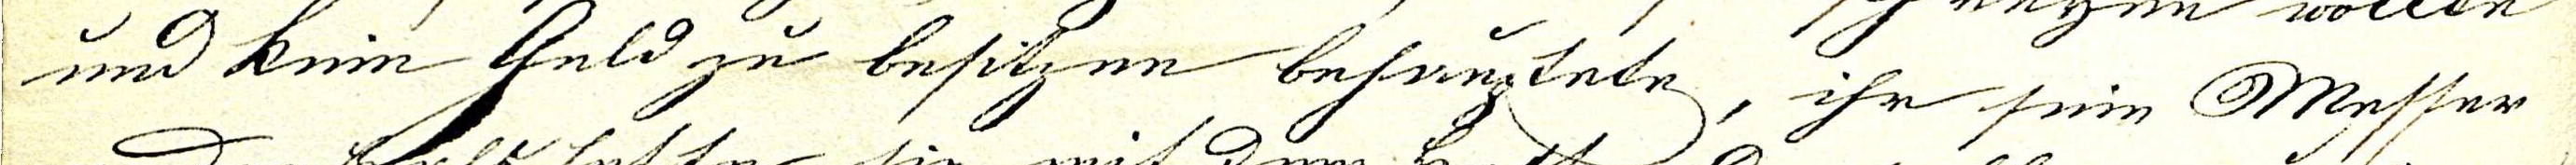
und kein Geld zu besitzen behauptete, ihr sein Messer
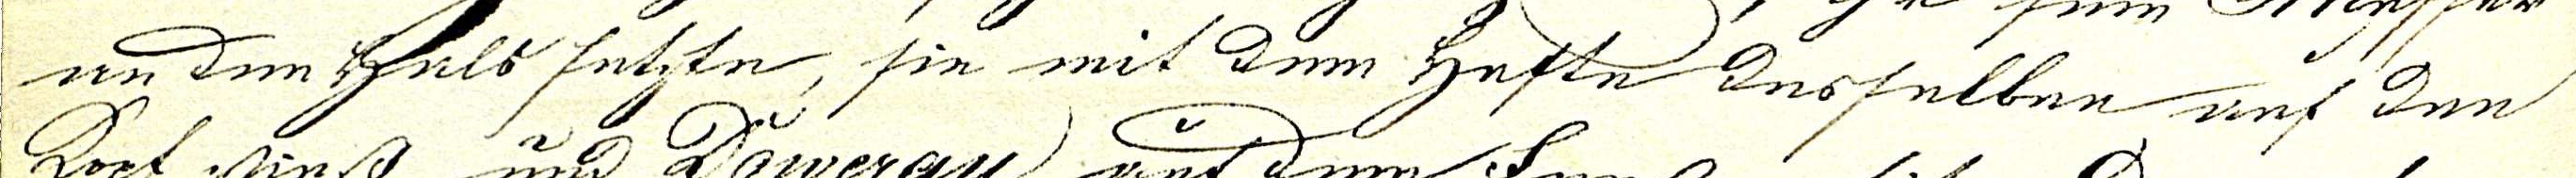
an den Hals setzte, sie mit dem Hefte desselben auf den
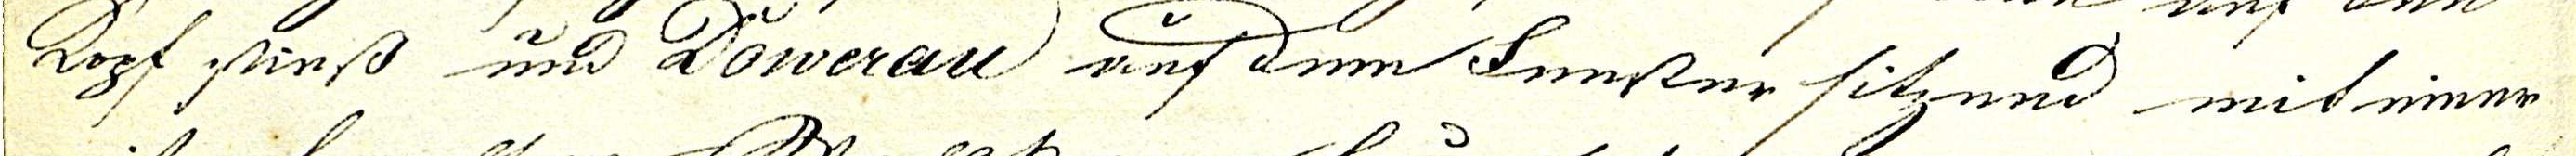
Kopf stieß und Dowerau auf dem Fenster sitzend mit einer
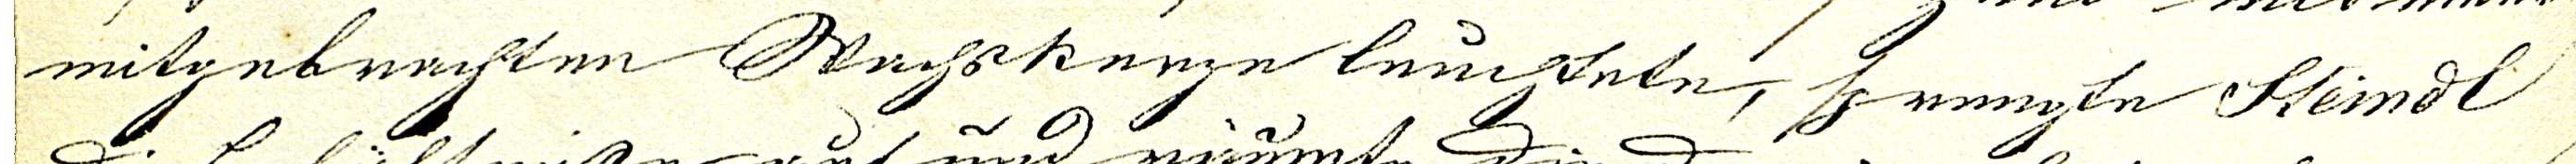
mitgebrachten Wachskerze leuchtete, sprengte Heindl
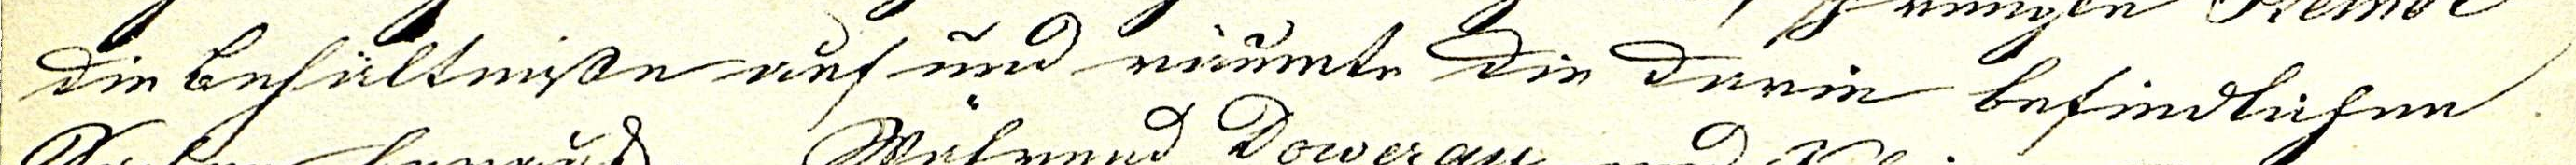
die Behältniße auf und räumte die darin befindlichen
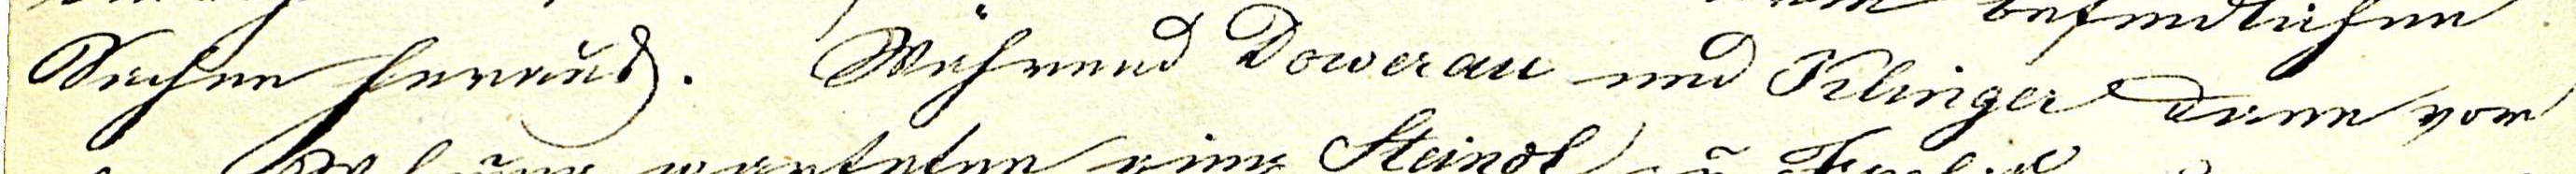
Sachen heraus. Während Dowerau und Klinger dann vor
